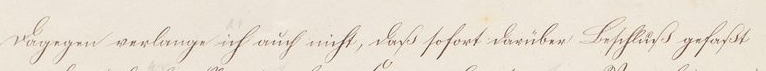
Dagegen verlange ich auch nicht, daß sofort darüber Beschluß gefaßt
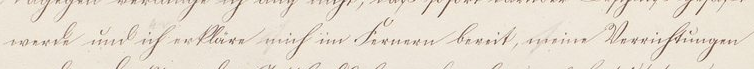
werde und ich erkläre mich in Fernern bereit, meine Verrichtungen
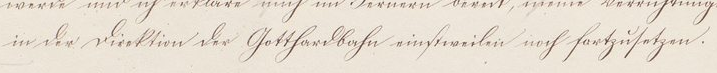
in der Direktion der Gotthardbahn einstweilen noch fortzusetzen.
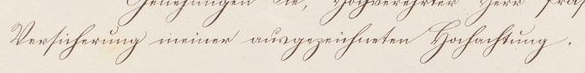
Versicherung meiner ausgezeichneten Hochachtung.
